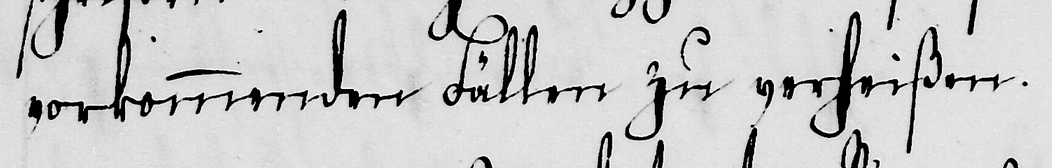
vorkommenden Fällen zu verheißen.
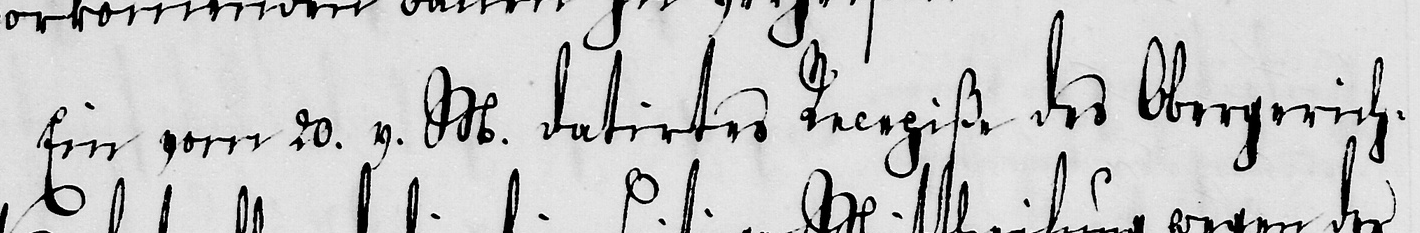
Ein vom 20. v. M. datirtes Recepiße des Obergerich¬
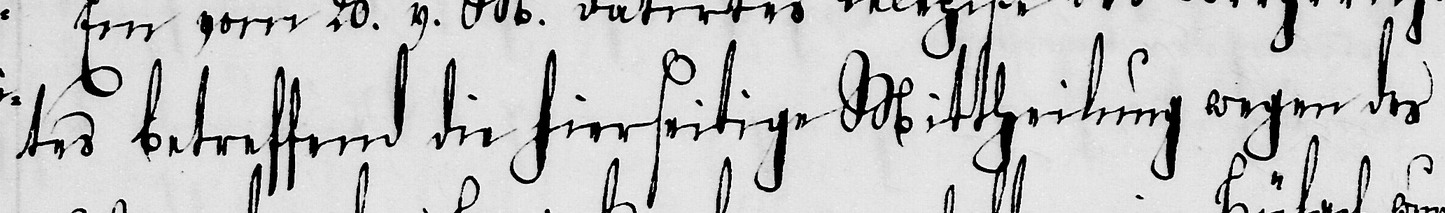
tes betreffend die hierseitige Mittheilung wegen des
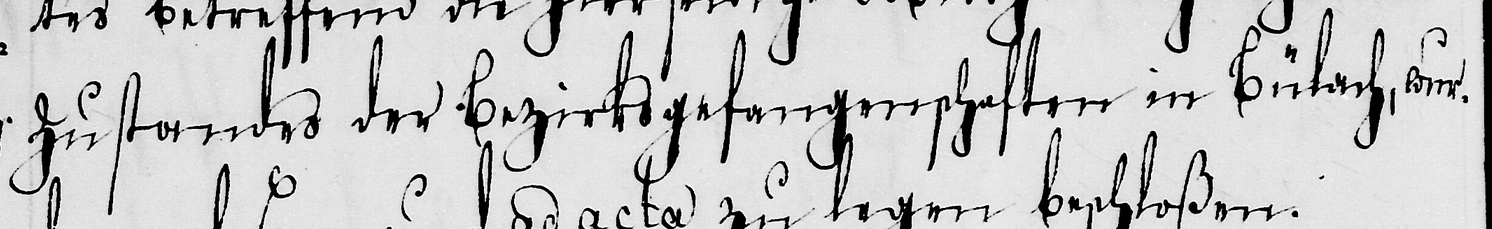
Zustandes der Bezirksgefangenschaften in Bülach, wur¬
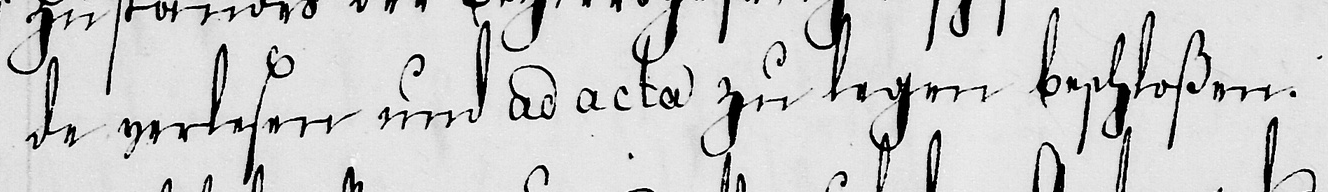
de verlesen und ad acta zu legen beschloßen.
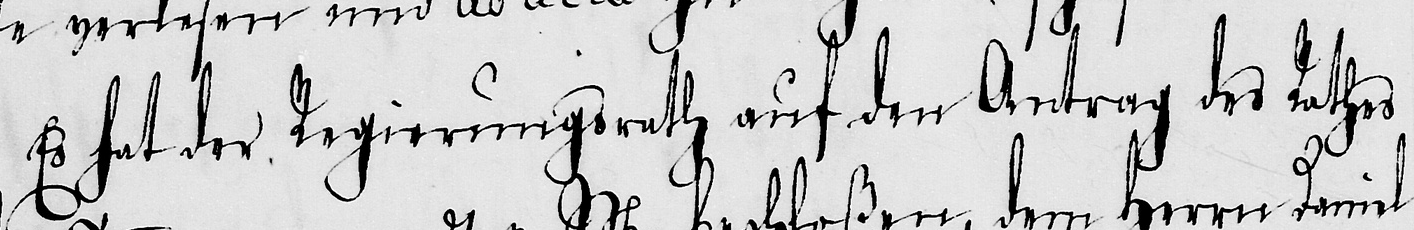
Es hat der Regierungsrath auf den Antrag des Rathes
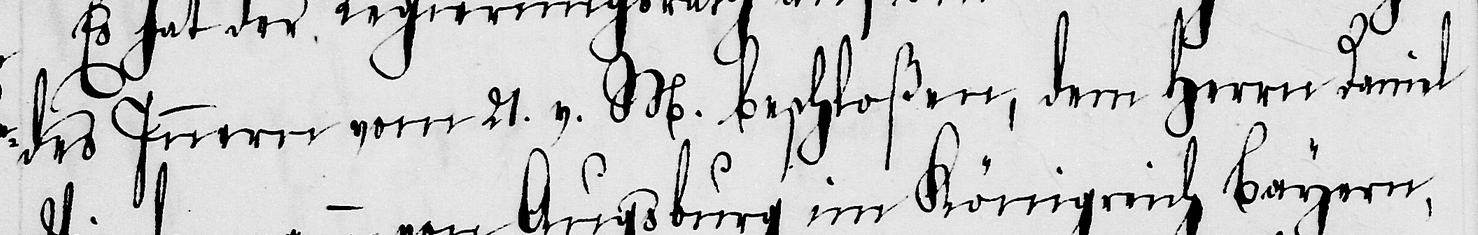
des Innern vom 21. v. M. beschloßen, dem Herrn Daniel
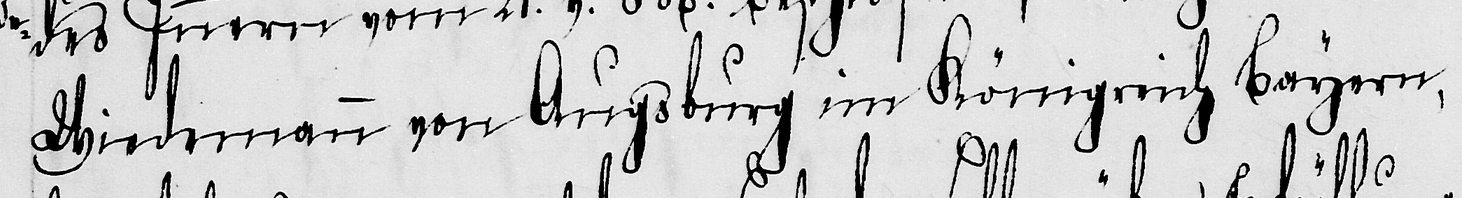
Wiedemann von Augsburg im Königreich Bayern,
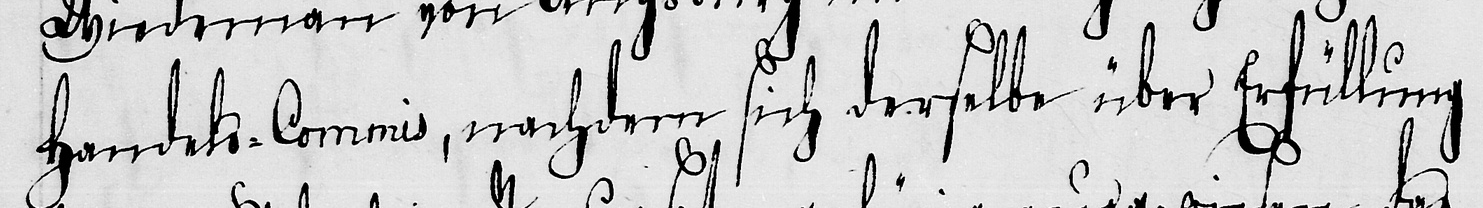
Handels-Commis, nachdem sich derselbe über Erfüllung
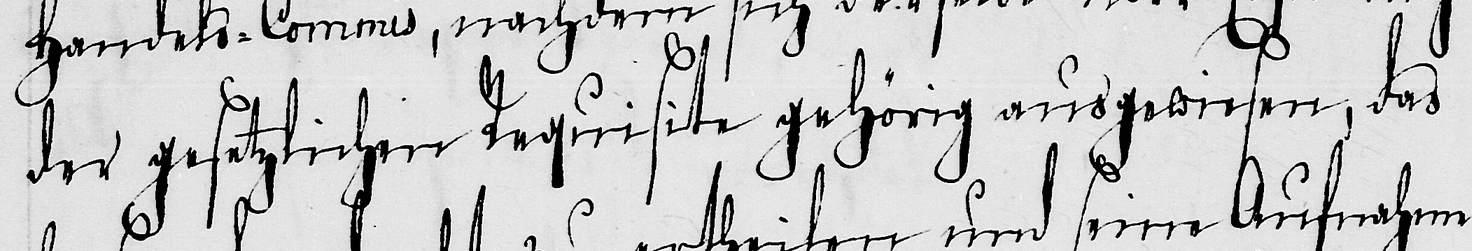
der gesetzlichen Requisite gehörig ausgewiesen, das
